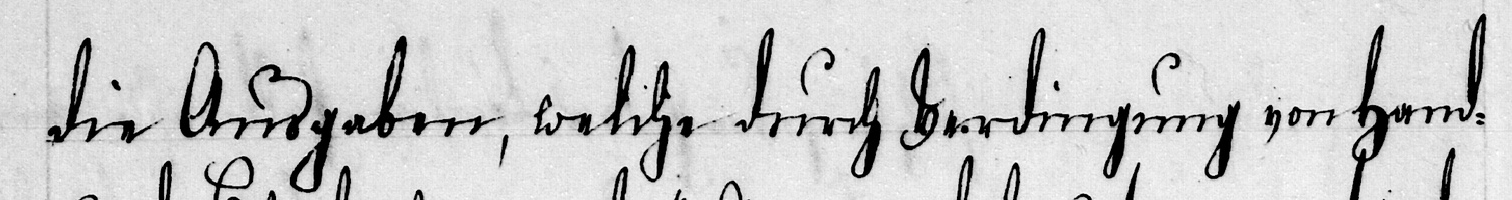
die Ausgaben, welche durch Verdingung von Hand-
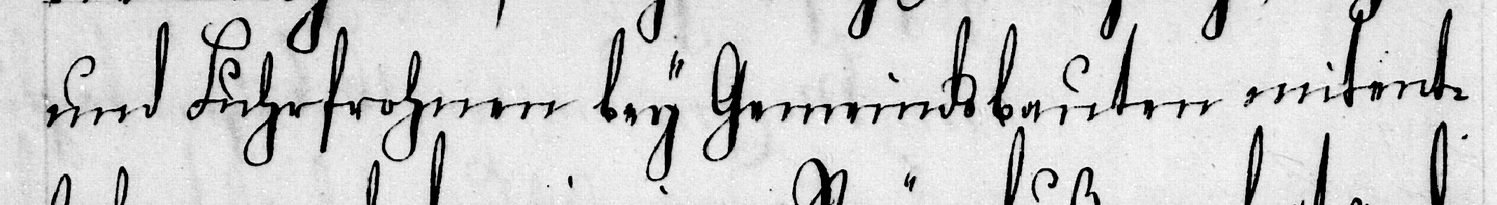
und Fuhrfrohnen bey Gemeindsbauten mitent¬
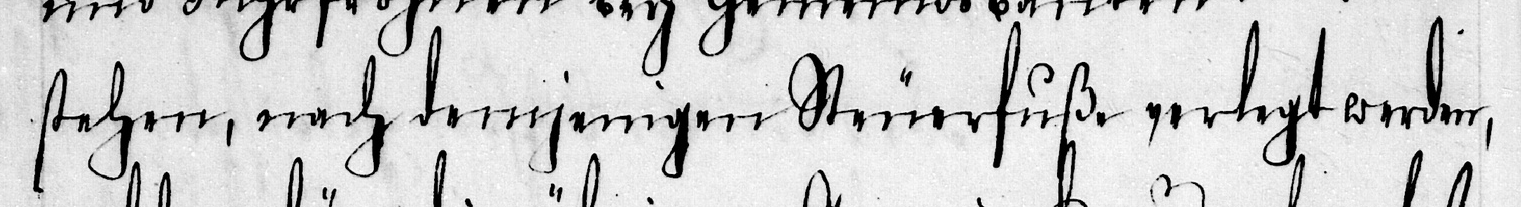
stehen, nach demjenigen Steuerfuße verlegt werden,
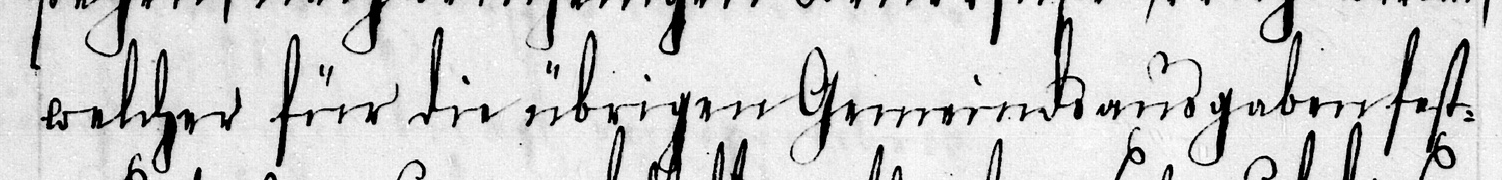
welcher für die übrigen Gemeindsausgaben fest¬
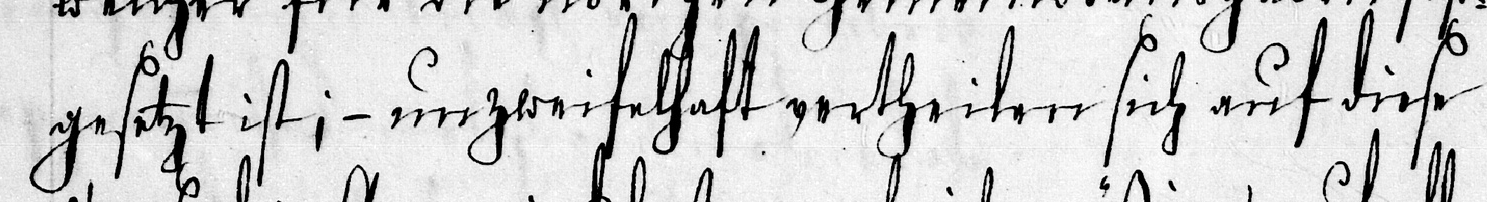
gesetzt ist; – unzweifelhaft vertheilen sich auf diese
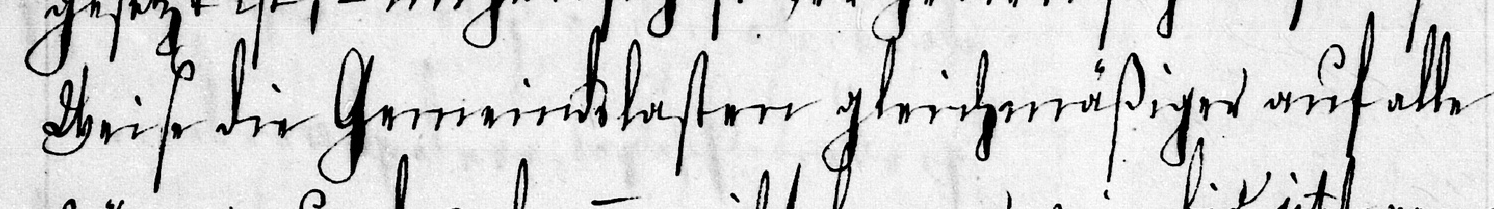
Weise die Gemeindslasten gleichmäßiger auf alle
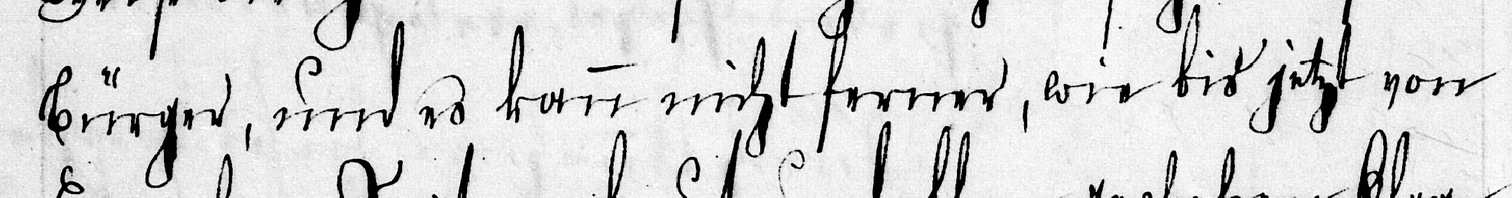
Bürger, und es kann nicht ferner, wie bis jetzt von
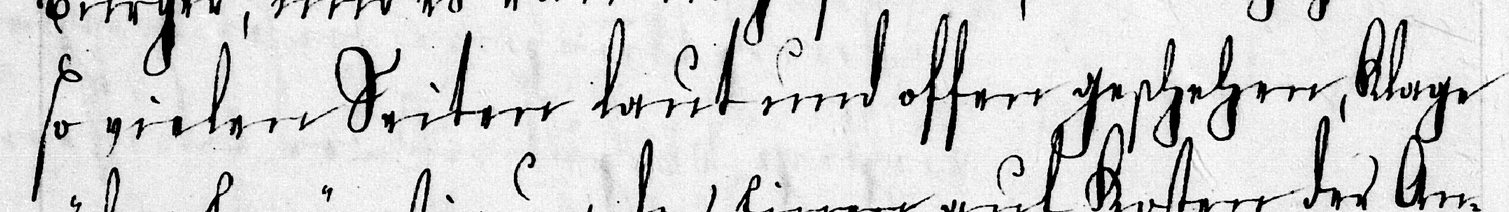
so vielen Seiten laut und offen geschehen, Klage
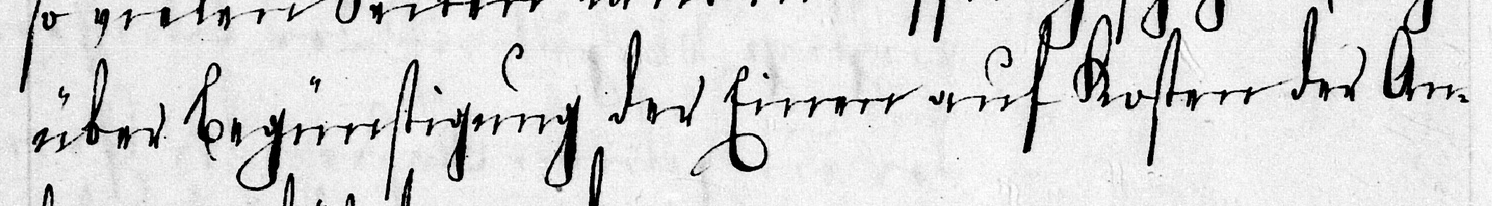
über Begünstigung der Einen auf Kosten der An¬
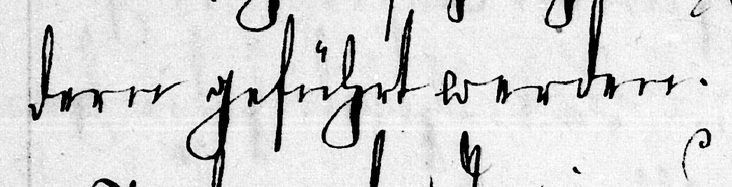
dern geführt werden.
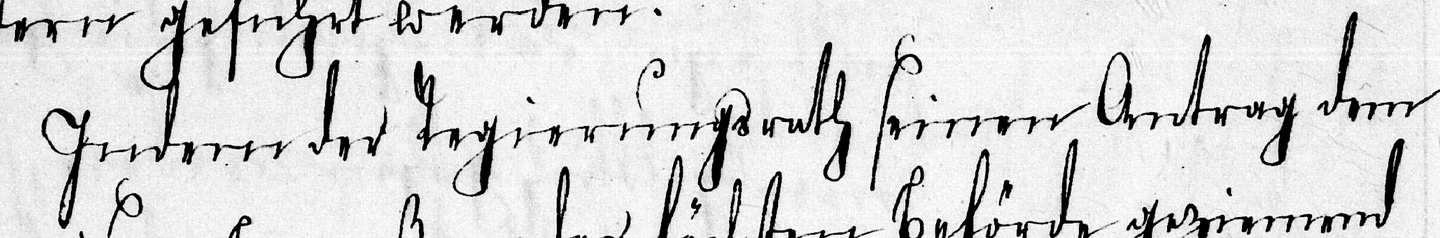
Indem der Regierungsrath seinen Antrag dem
